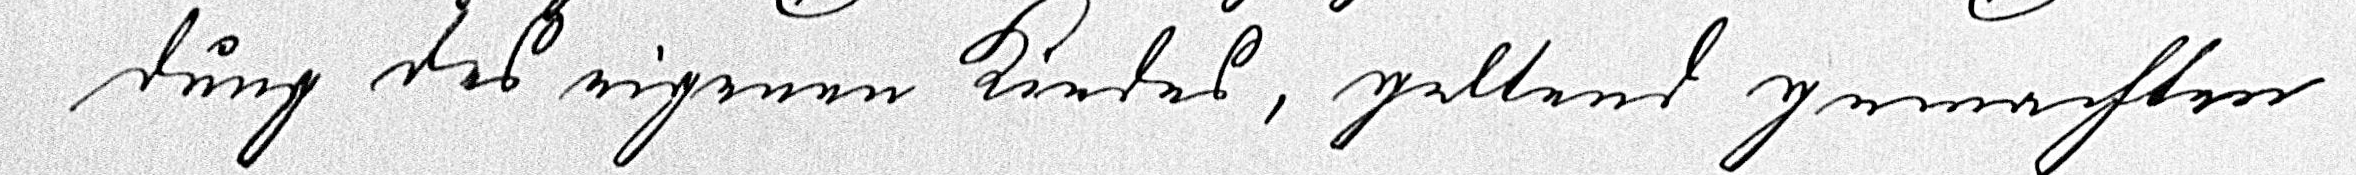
dung des eigenen Kindes, geltend gemachten
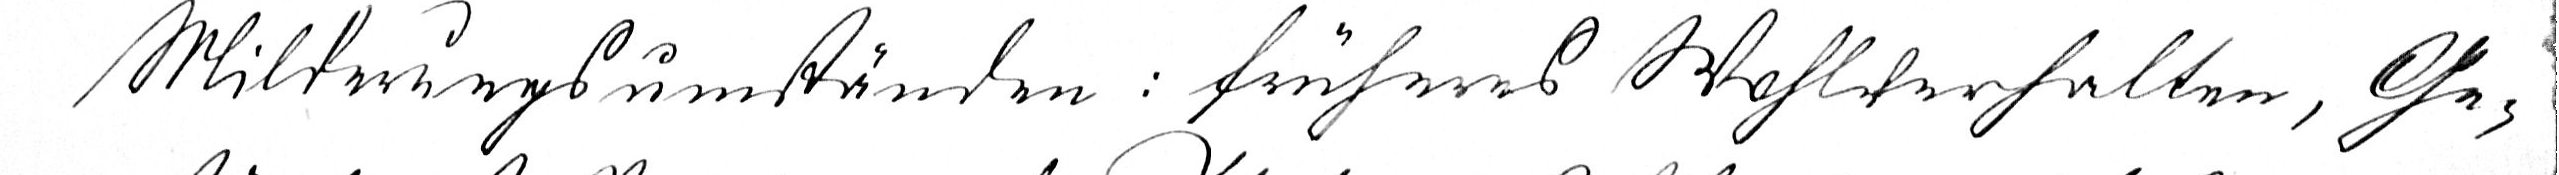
Milderungsumständen: früheres Wohlverhalten, Ge¬
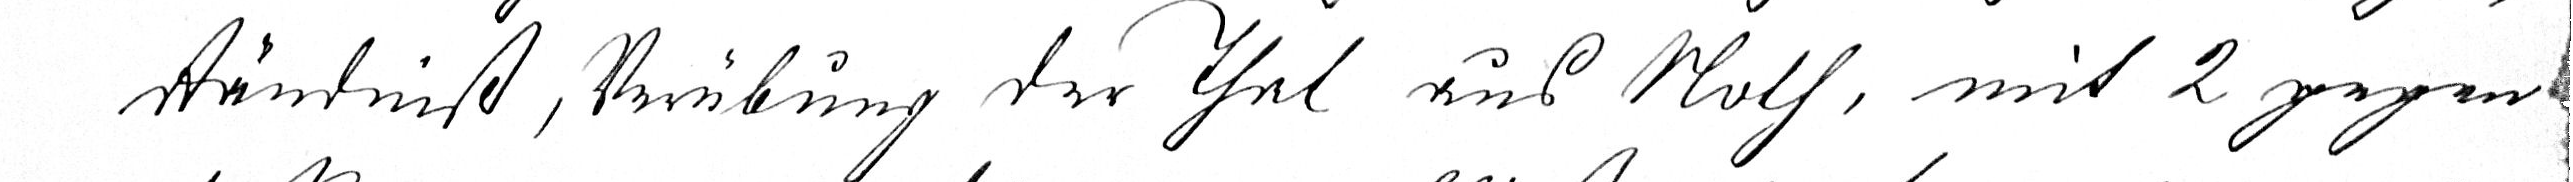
ständniß, Verübung der That aus Noth, mit 2 gegen
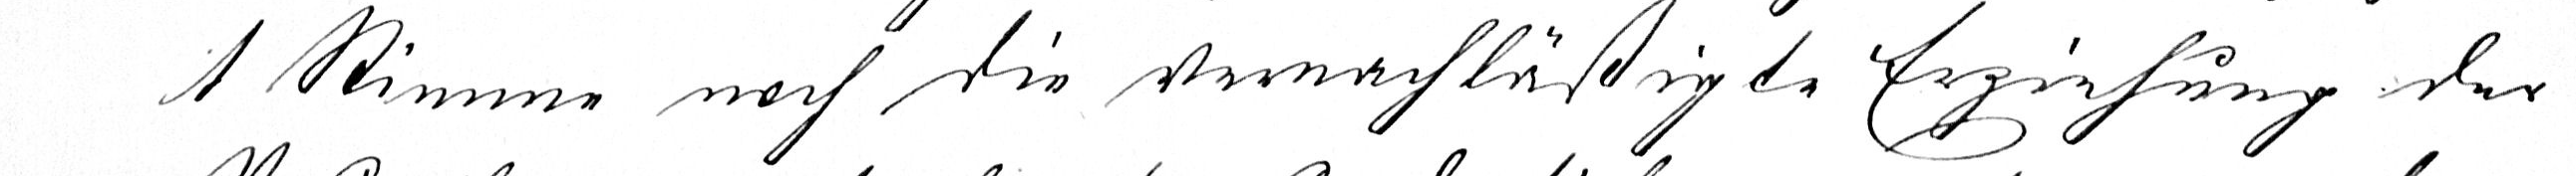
1 Stimme noch die vernachläßigte Erziehung der
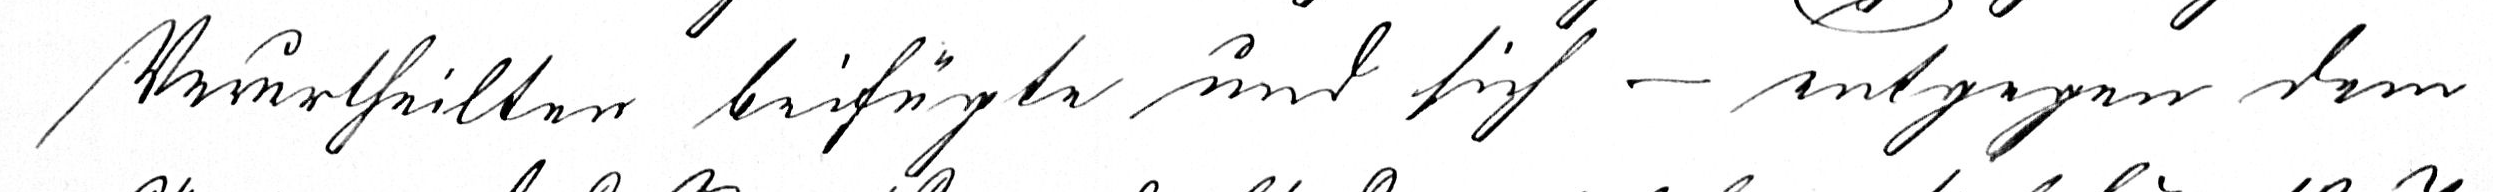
Verurtheilten beifügte und sich — entgegen dem
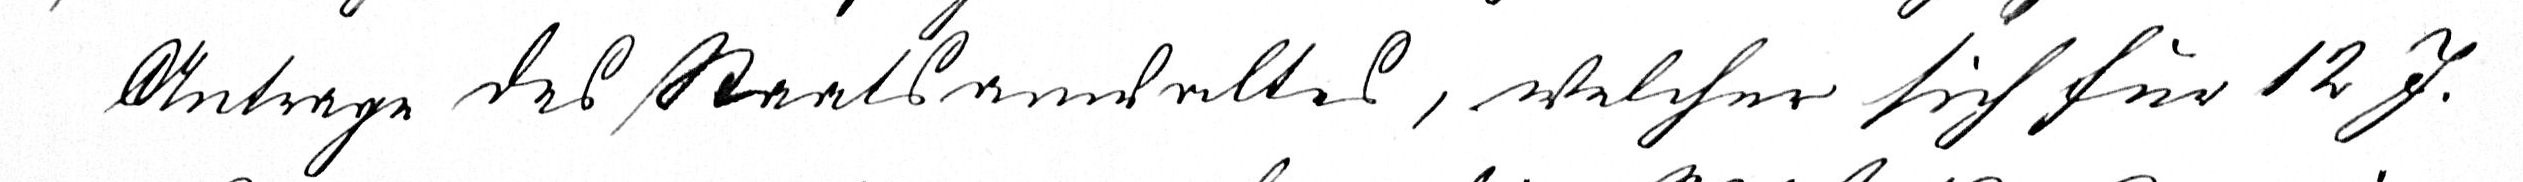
Antrage des Staatsanwaltes, welcher sich für 12 J.
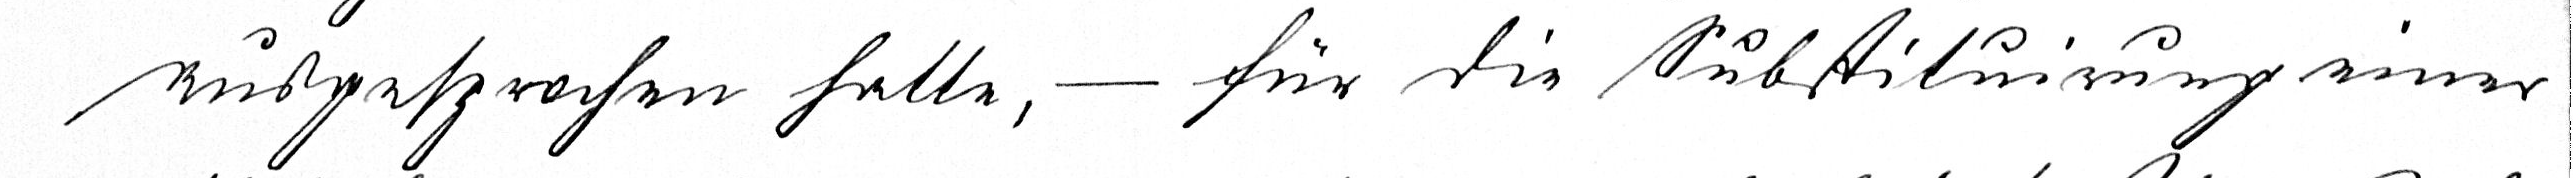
ausgesprochen hatte, — für die Substituirung einer
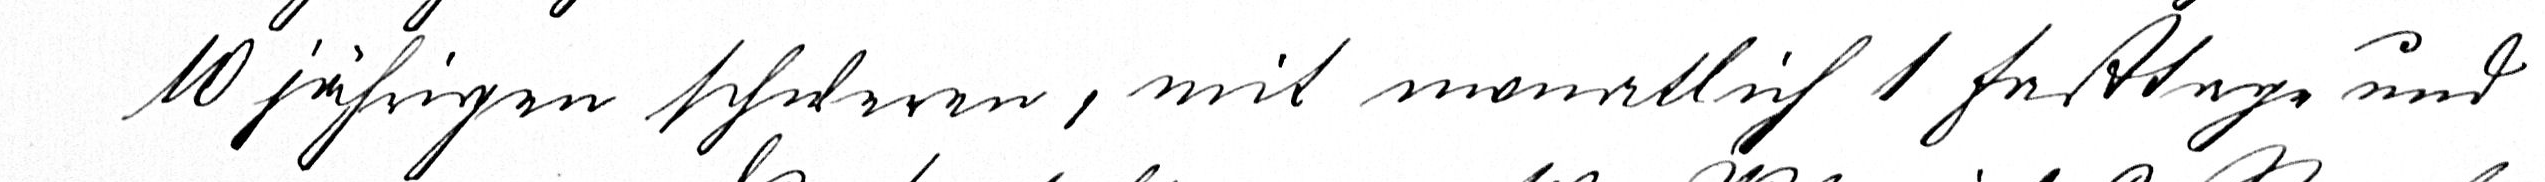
10 jährigen schweren, mit monatlich 1 Fasttage und
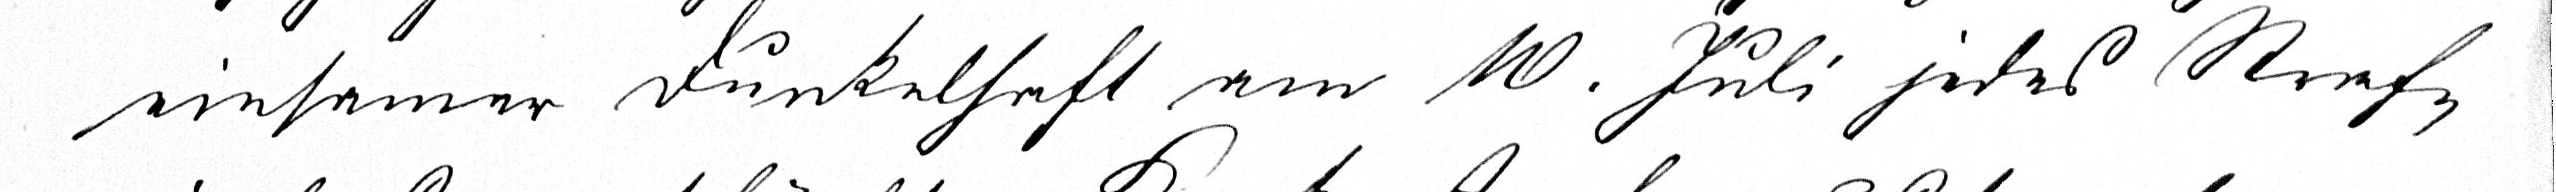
einsamer Dunkelhaft am 10. Juli jedes Straf¬
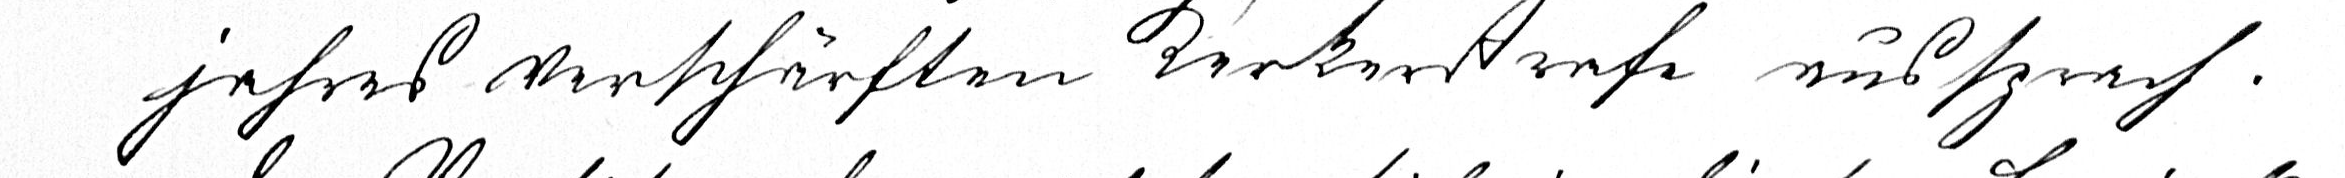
jahres verschärften Kerkerstrafe aussprach.
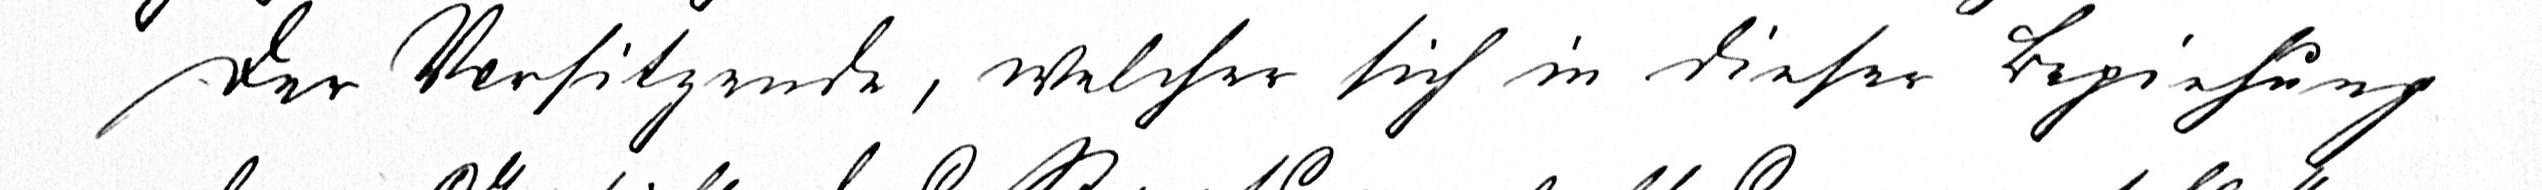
Der Versitzende, welcher sich in dieser Beziehung
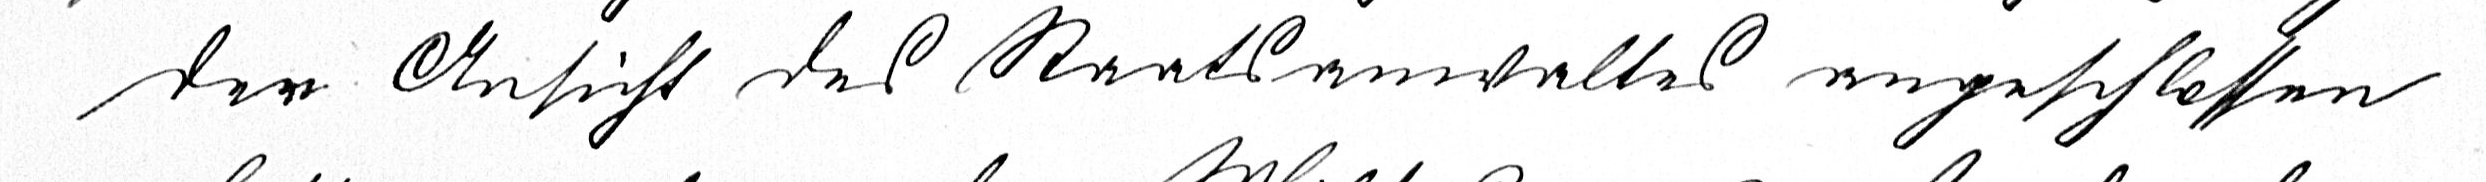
der Ansicht des Staatsanwaltes angeschlossen
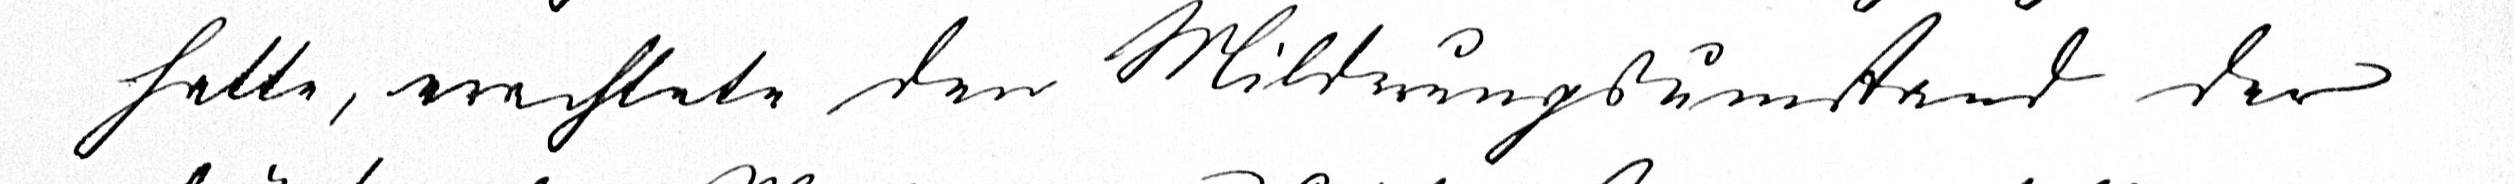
hatte, erachtete den Milderungsumstand der
